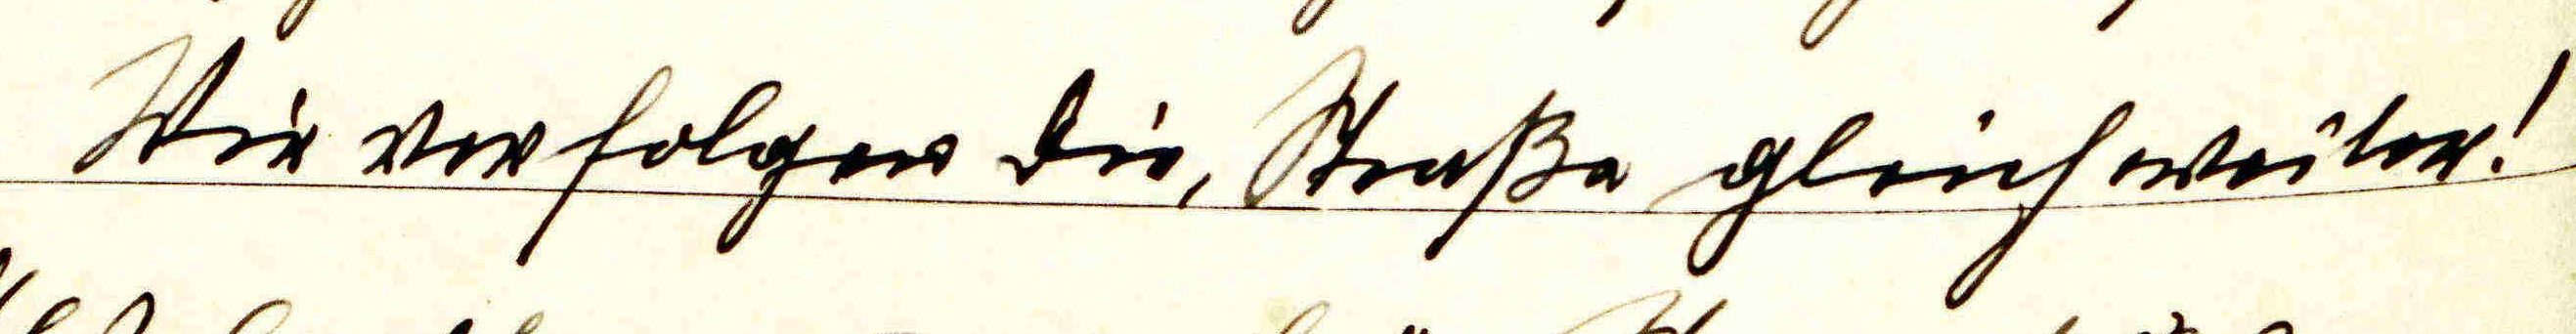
Wir verfolgen die Straße gleich weiter!
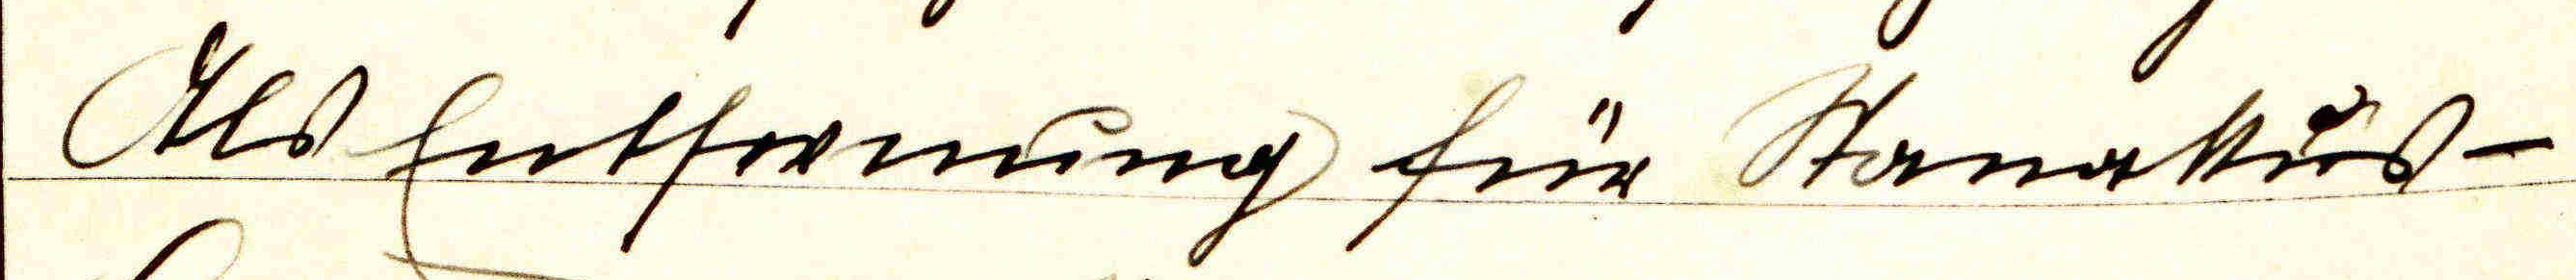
Als Entfernung für Stanakus-
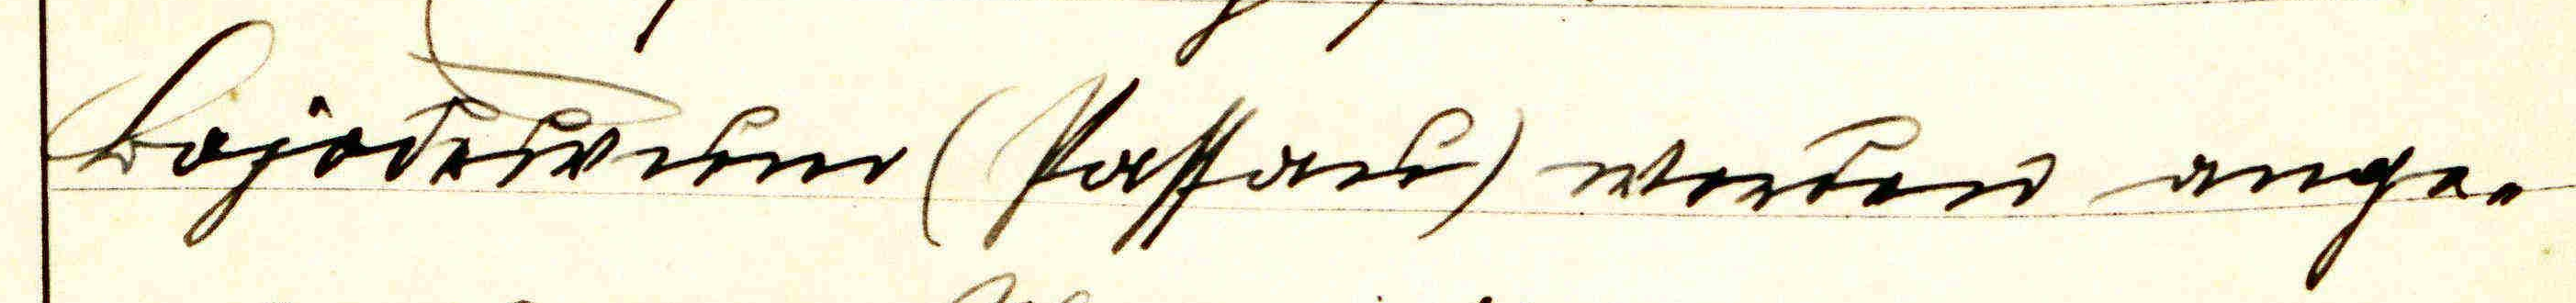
Bojod??? (Passau) werden ange-
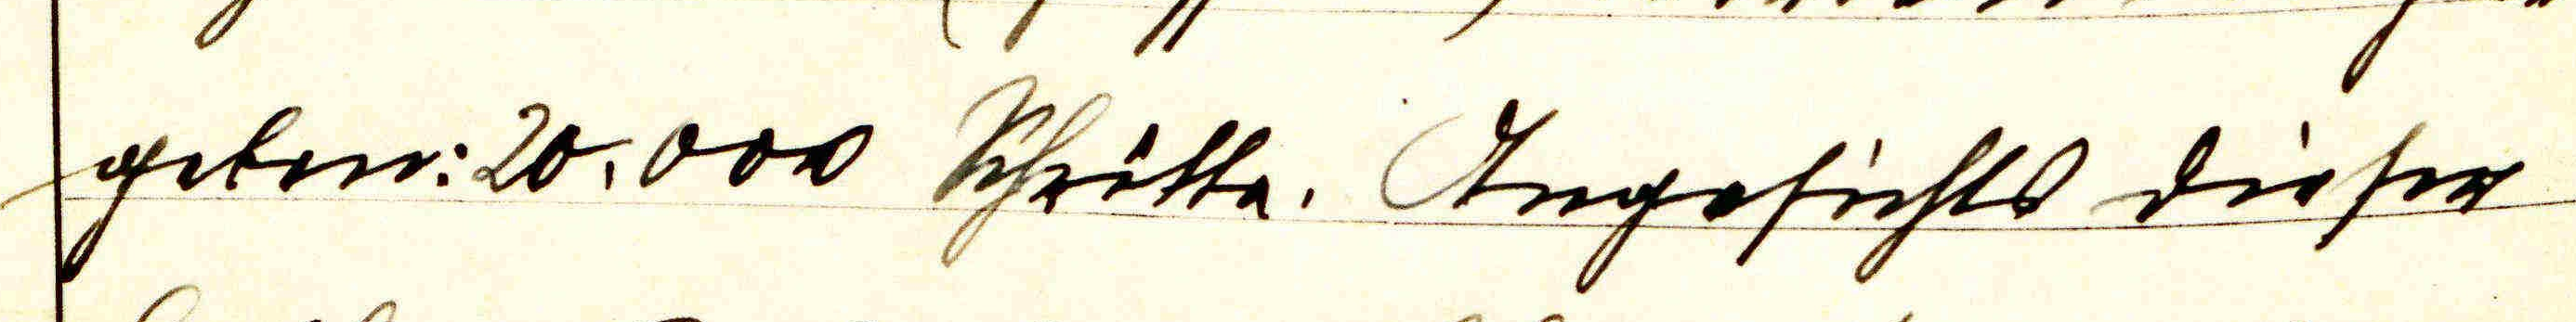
geben: 20.000 Schritte. Angesichts dieser
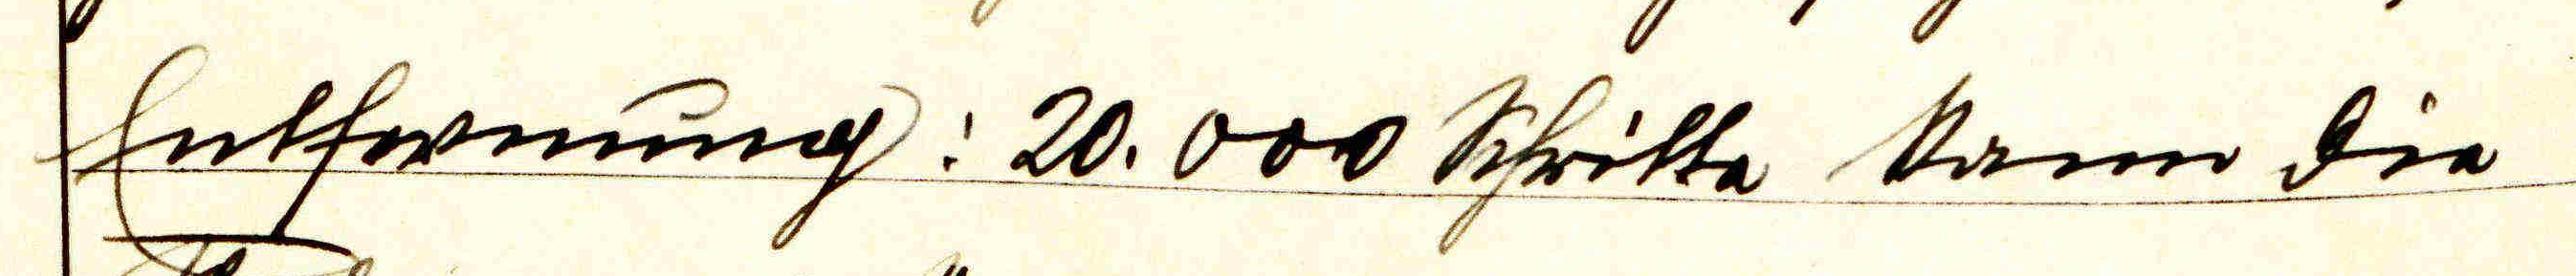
Entfernung: 20.000 Schritte kam die
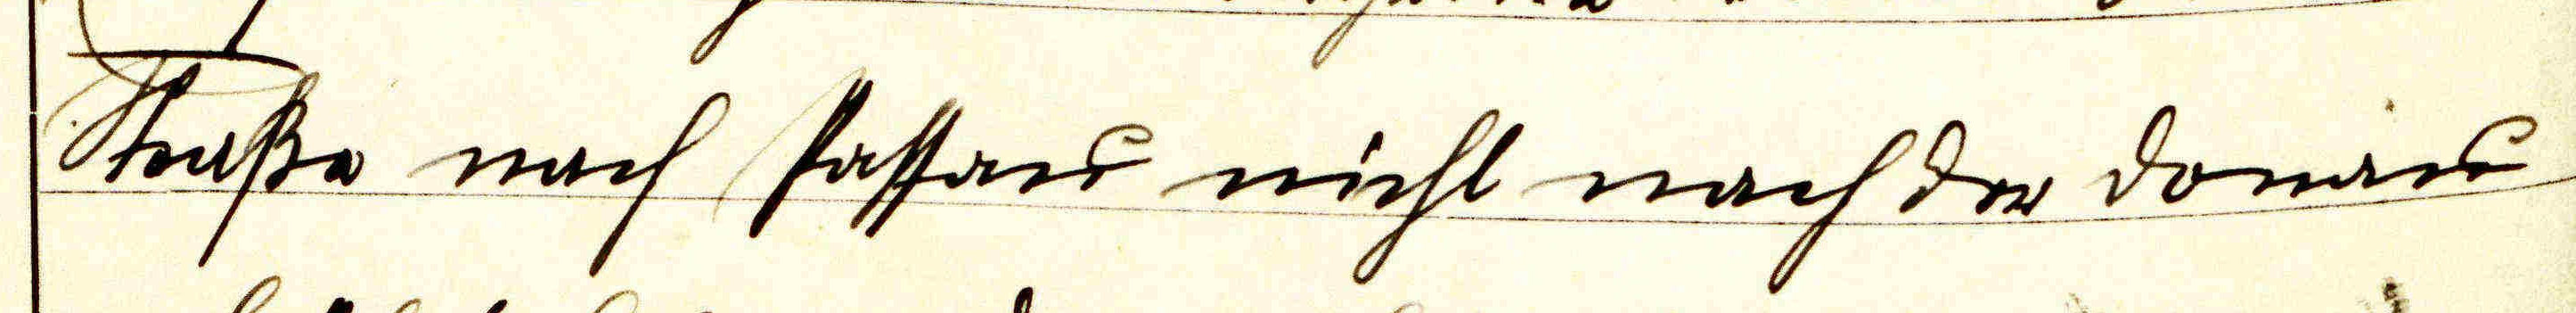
Straße nach Passau nicht nach der Donau
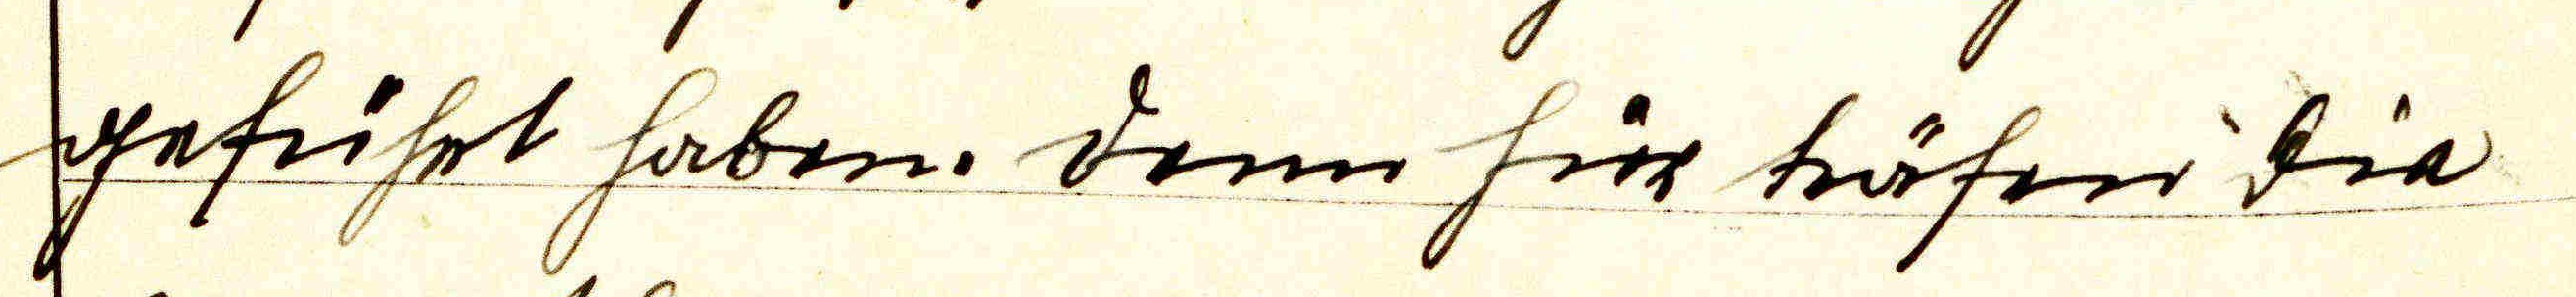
geführt haben. Denn hier träfen die
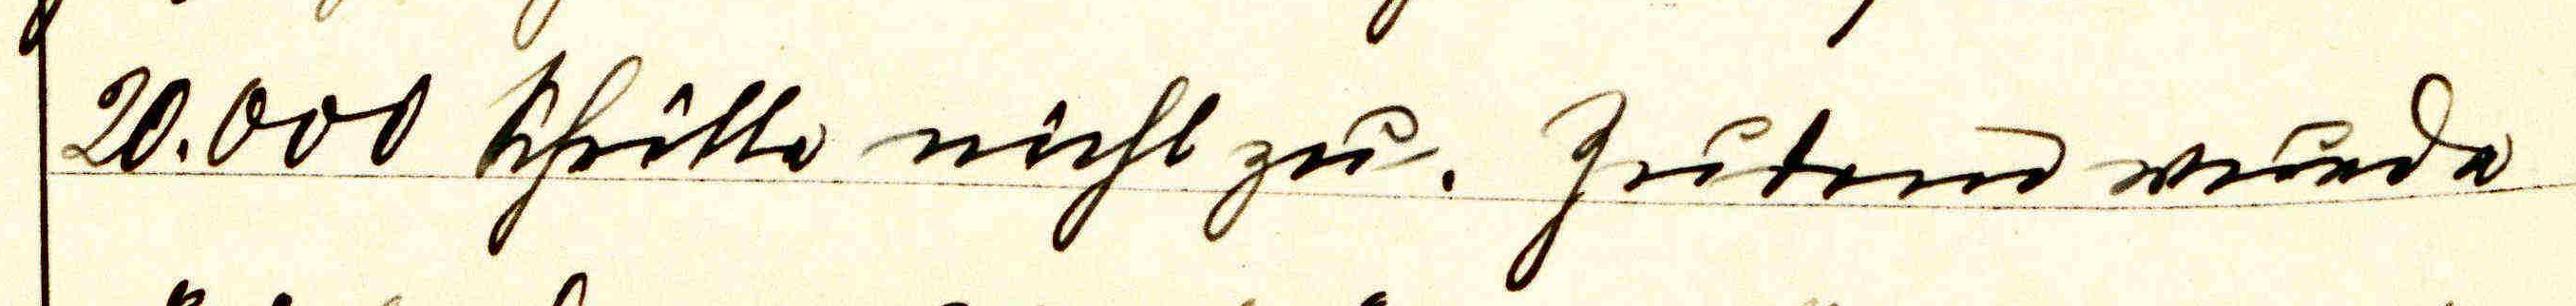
20.000 Schritte nicht zu. Zudem wurde
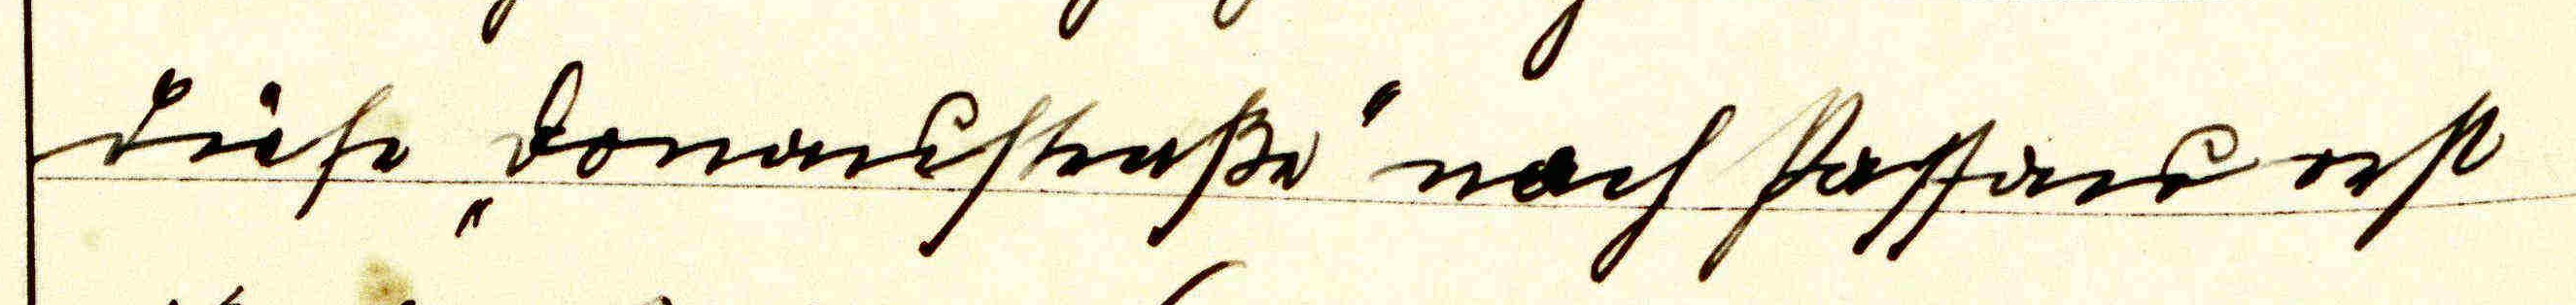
diese „Donaustraße“ nach Passau erst
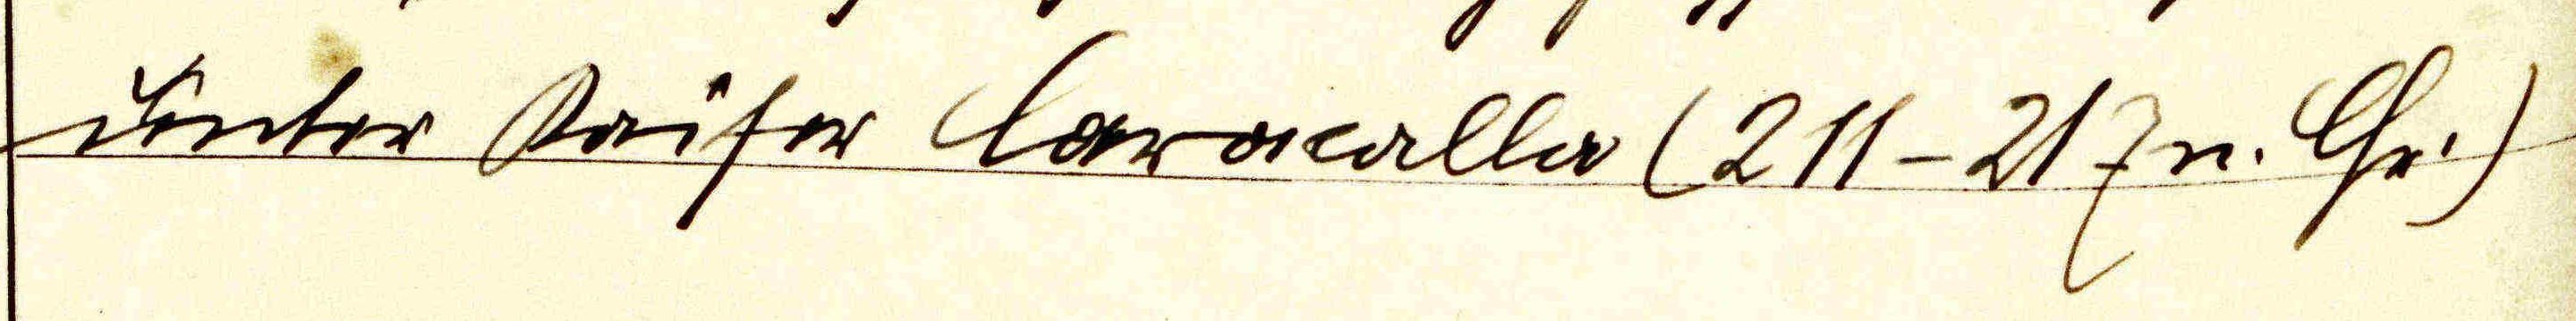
unter Kaiser Caracalla (211 – 217 n.Chr.)
